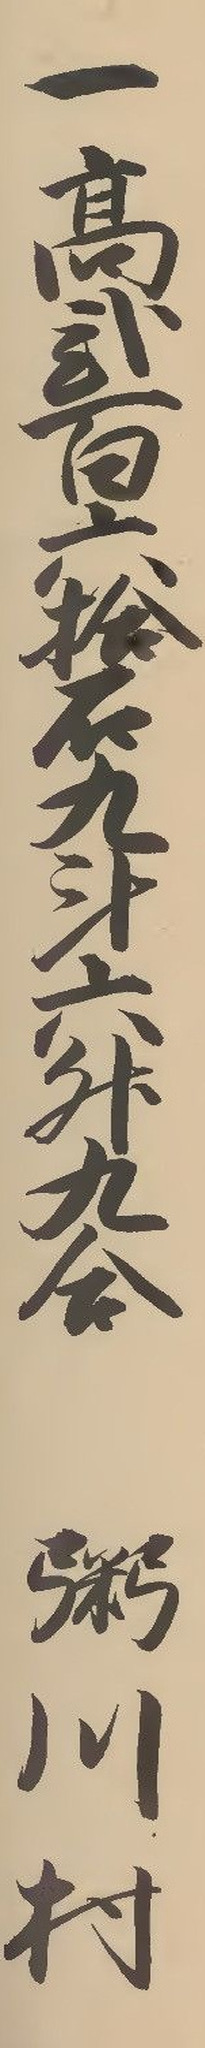一高弐百六拾石九斗六升九合粥川村
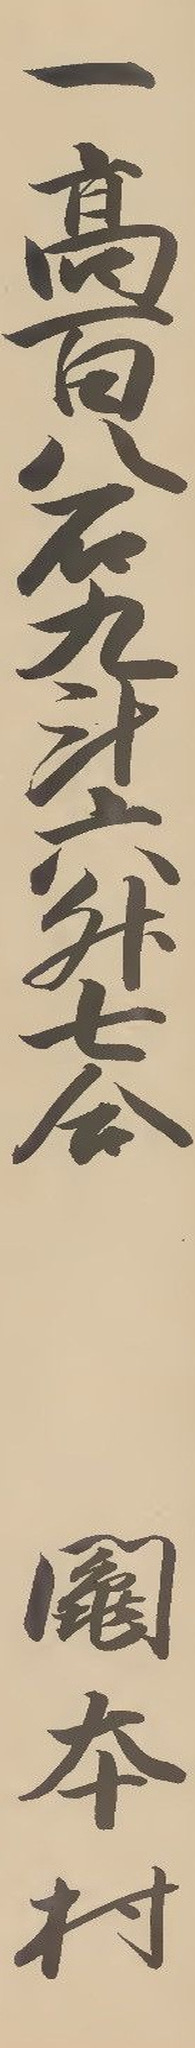一高百八石九斗六升七合鬮本村
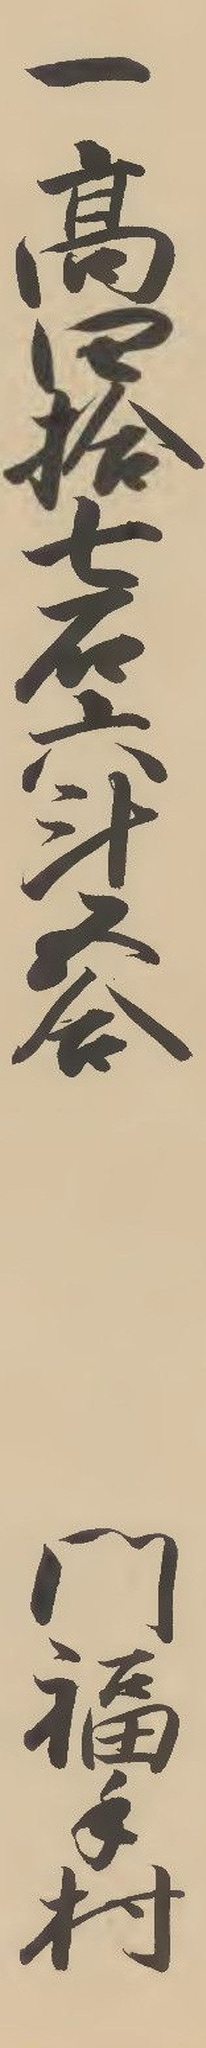一高四拾七石六斗五合門福手村
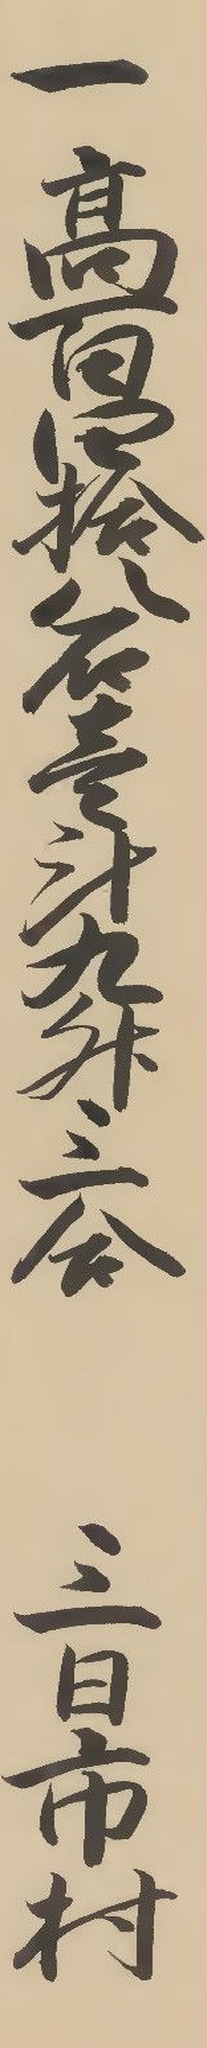一高百四拾八石壱斗九升三合三日市村
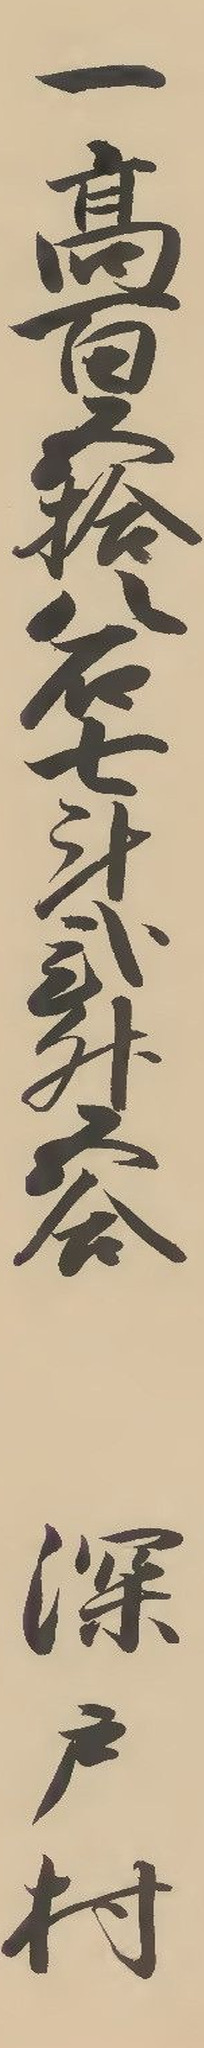一高百五拾八石七斗弐升五合深戸村

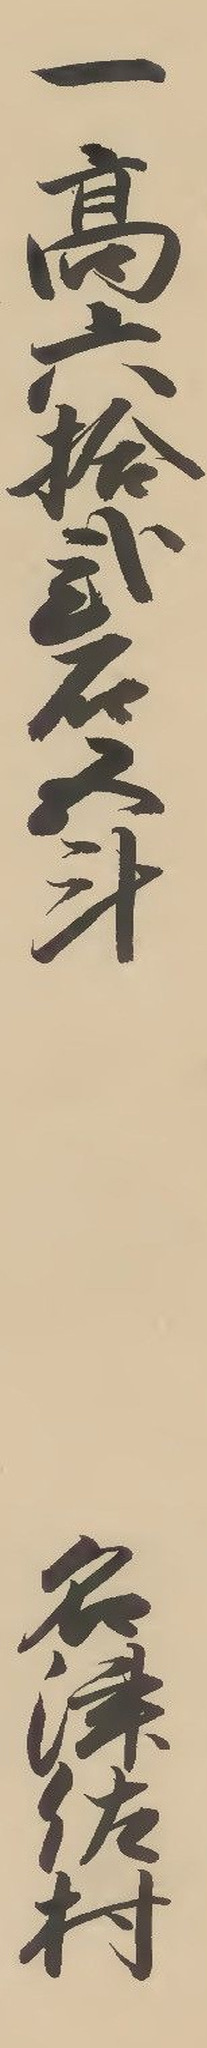一高六拾弐石五斗名津佐村
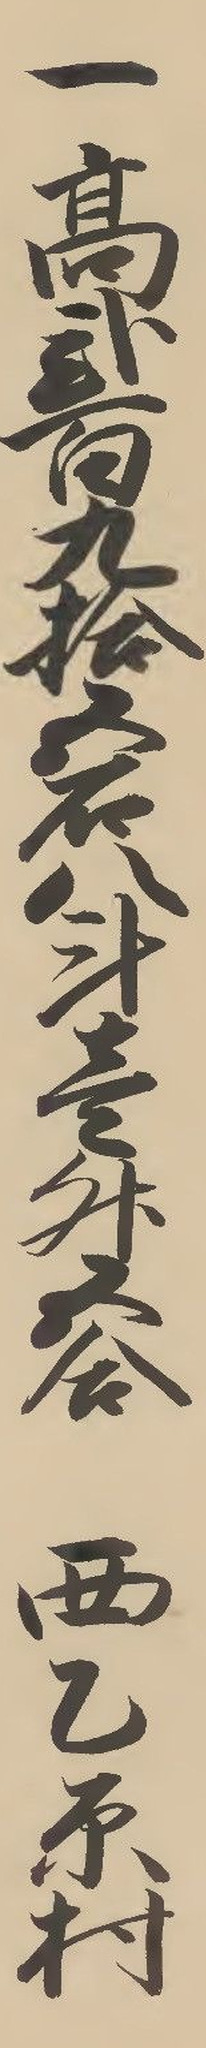一高弐百九拾五石八斗壱升五合西乙原村
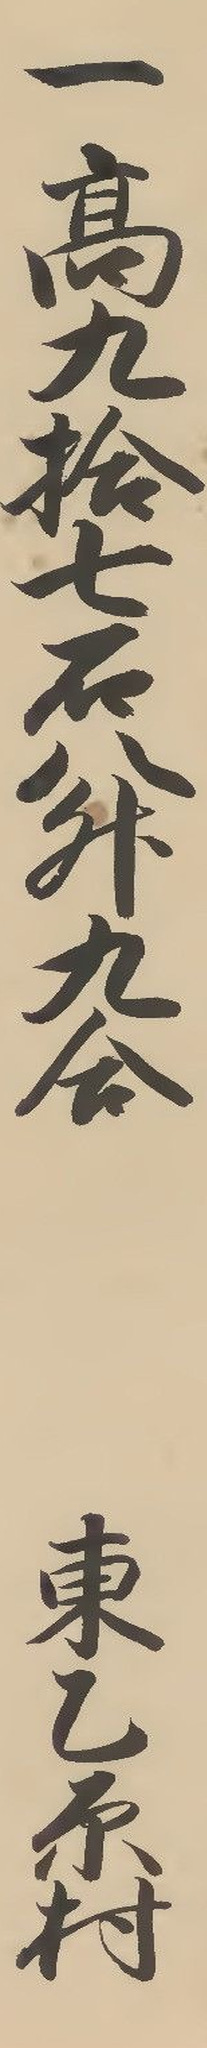一高九拾七石八升九合東乙原村
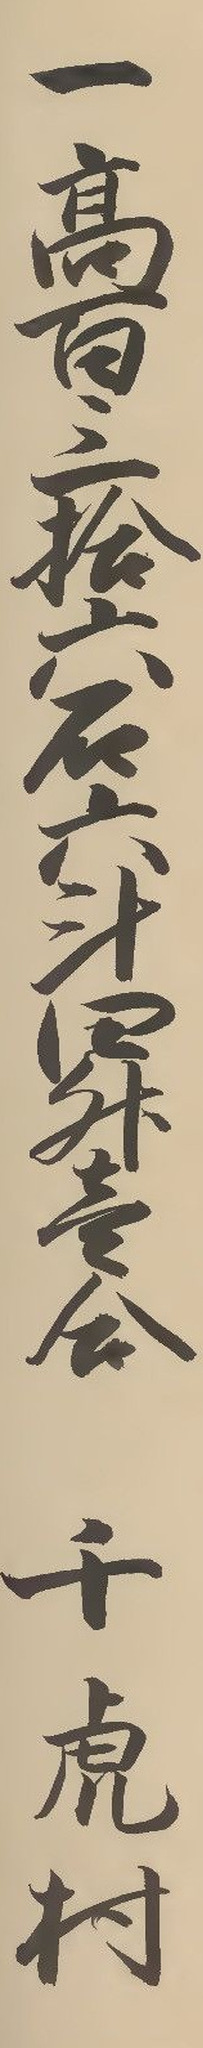一高百三拾六石六斗四升壱合千虎村
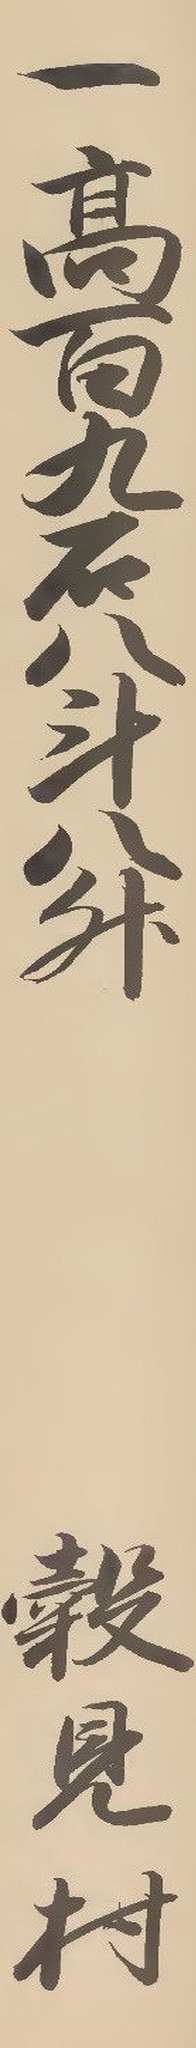一高百九石八斗八升穀見村
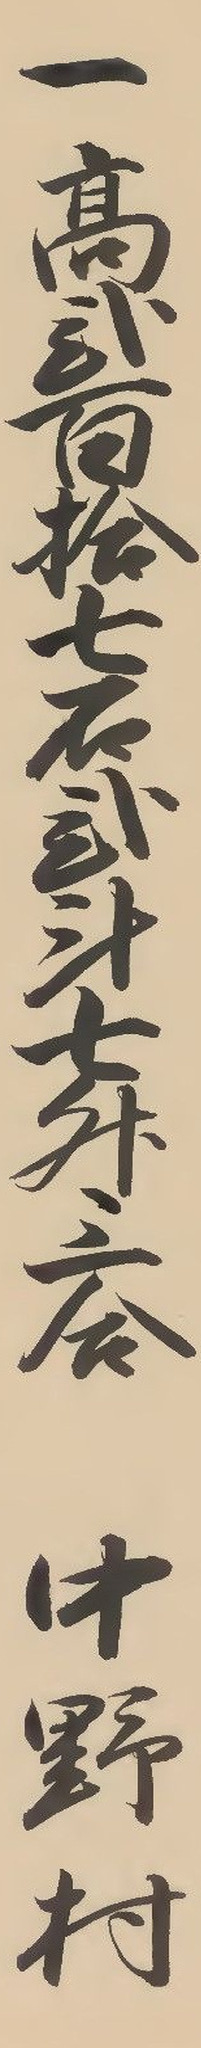一高弐百拾七石弐斗七升三合中野村
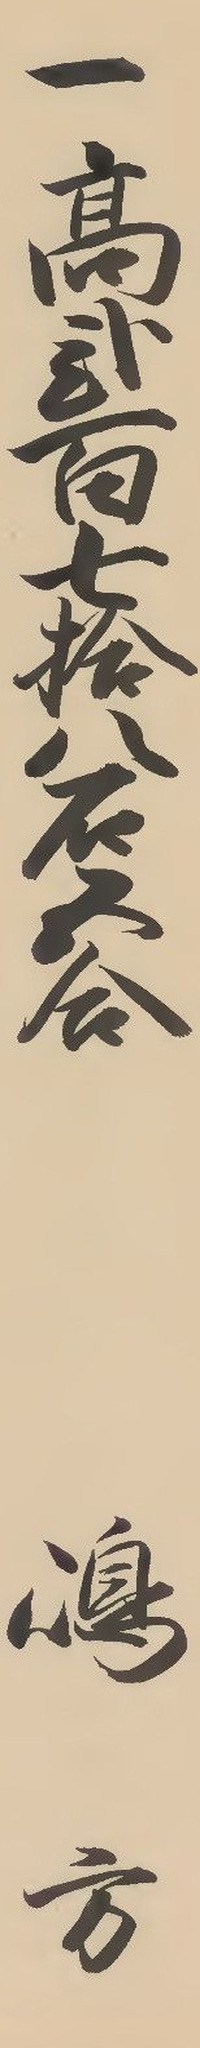一高弐百七拾八石五合島方
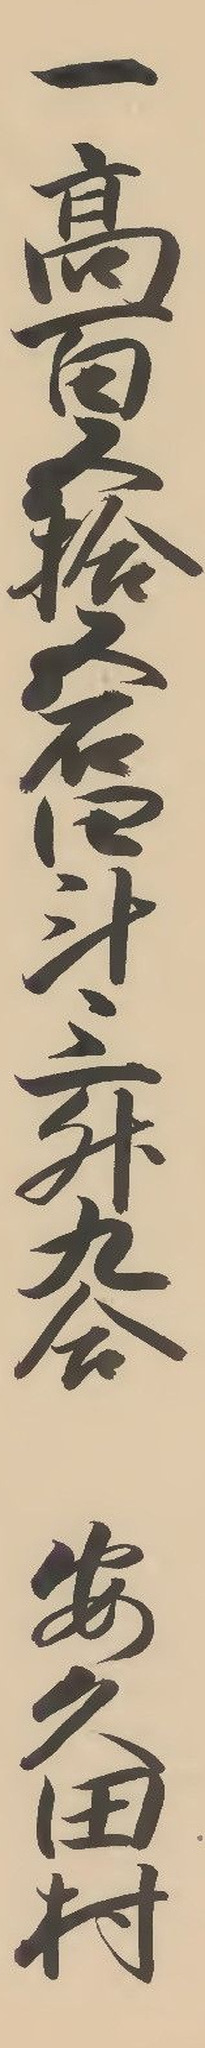一高百五拾五石四斗三升九合安久田村

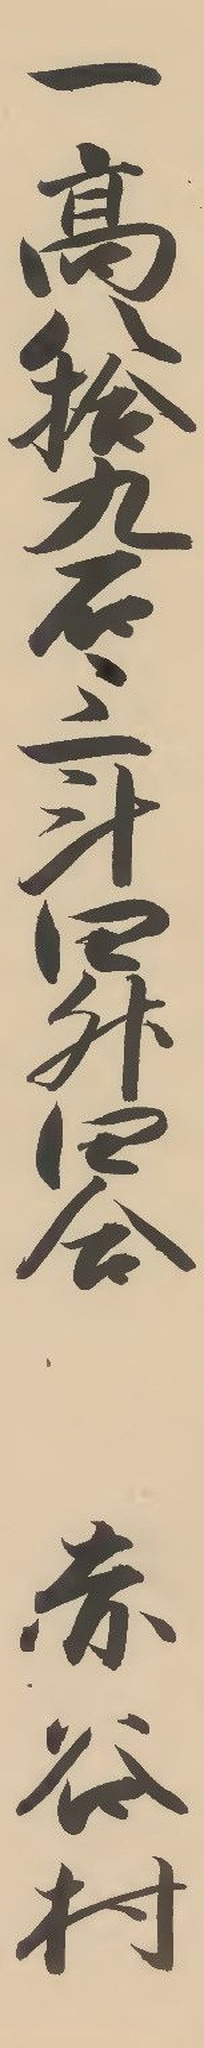一高八拾九石三斗四升四合赤谷村
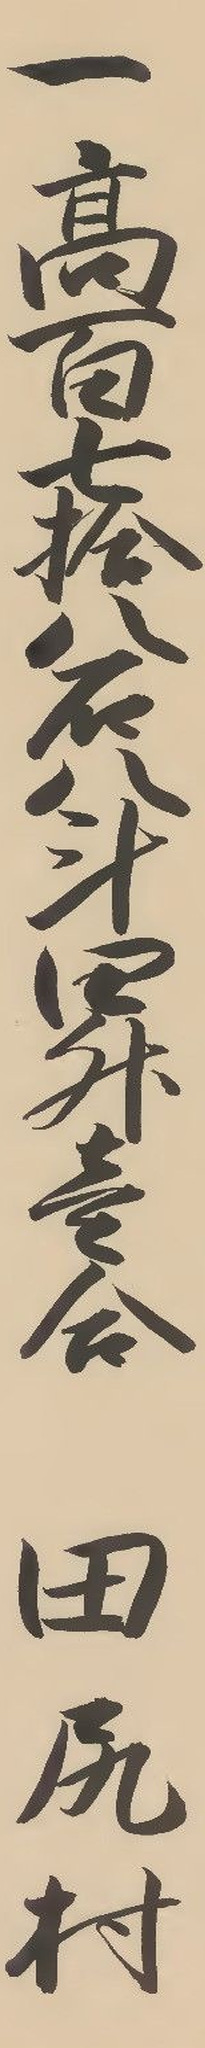一高百七拾八石八斗四升壱合田尻村
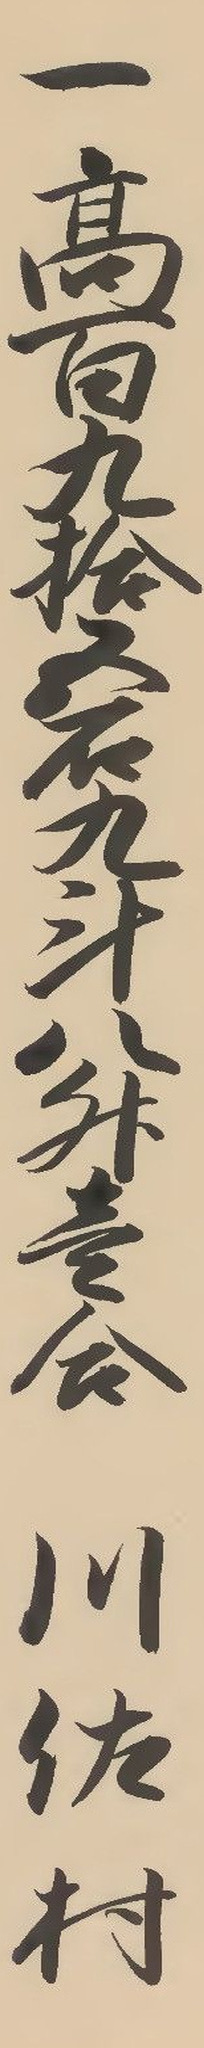一高百九拾五石九斗八升壱合川佐村
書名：美濃国郷帳
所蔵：国立公文書館 National Archives of Japan
